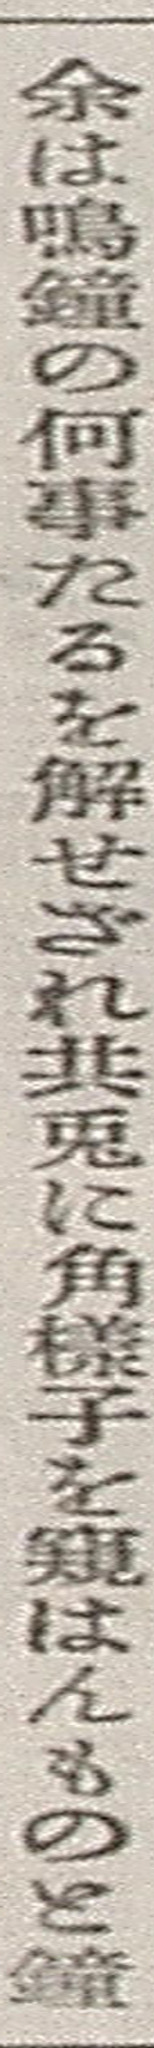余は鳴鐘の何事たるを解せざれ共兎に角様子を窺はんものと鐘
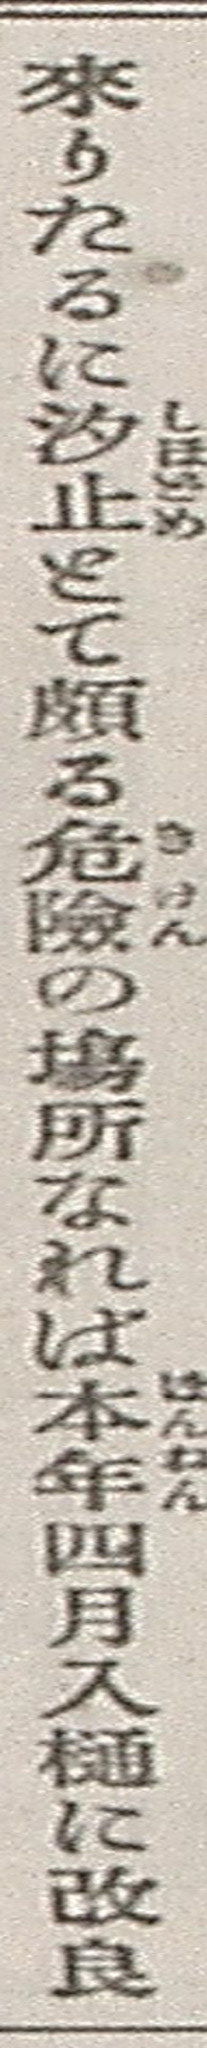来りたるに汐止とて頗る危険の場所なれば本年四月入樋に改良
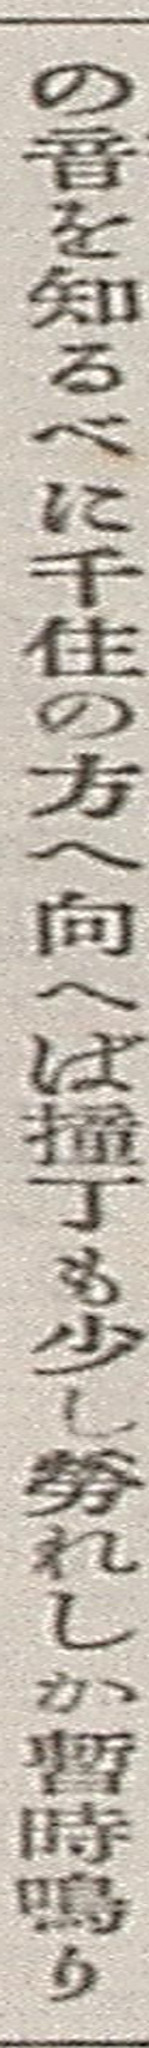の音を知るべに千住の方へ向へば撞丁も少し労れしか暫時鳴り
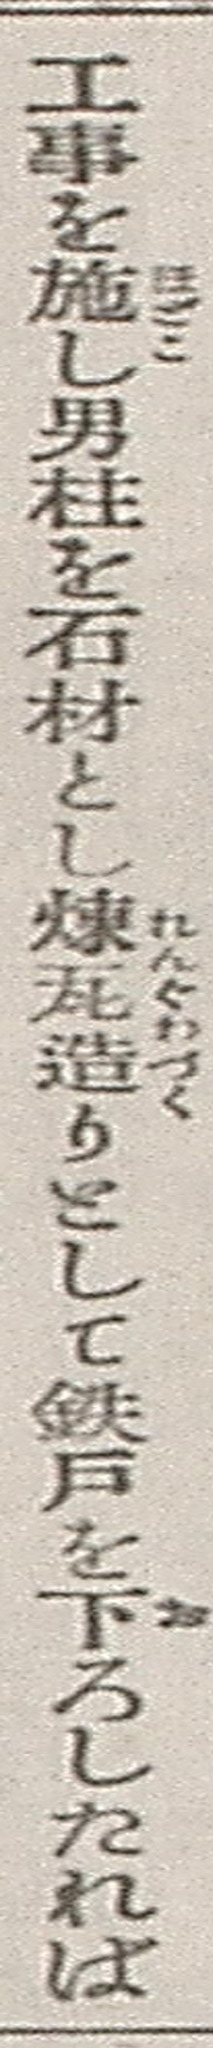工事を施し男柱を石材とし煉瓦造りとして鉄戸を下ろしたれば
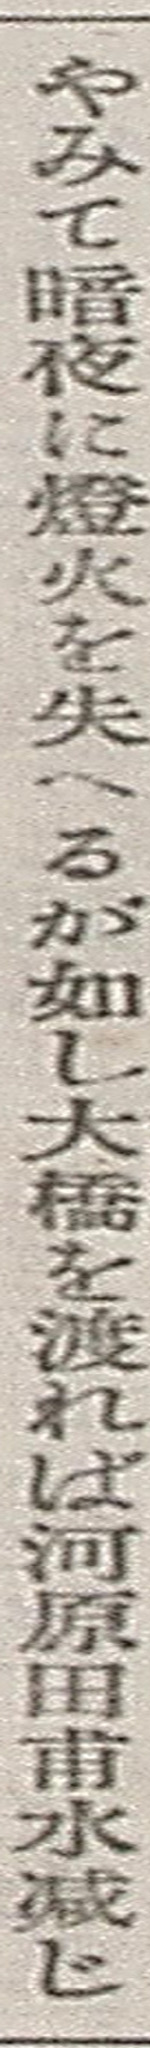やみて暗夜に燈火を失へるが如し大橋を渡れば河原田甫水減じ
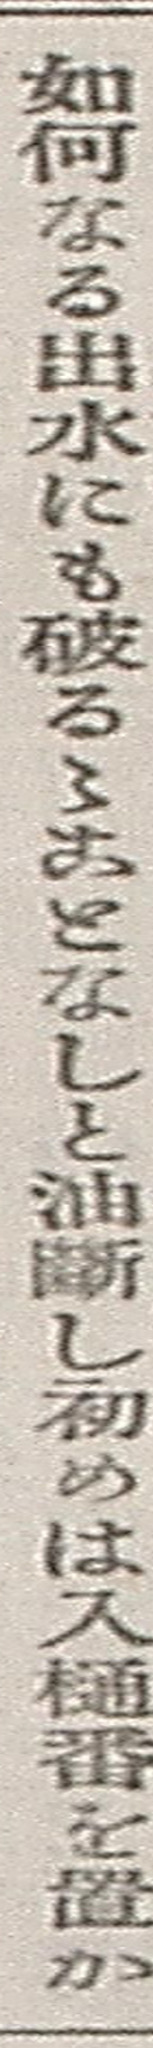如何なる出水にも破るゝことなしと油断し初めは入樋番を置か
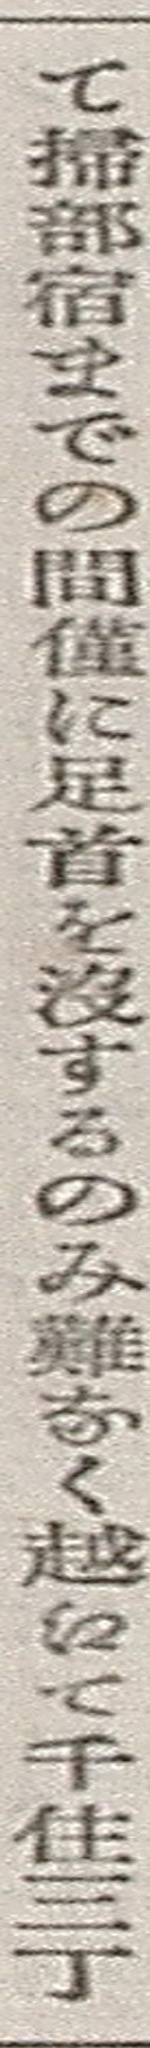て掃部宿までの間僅に足首を没するのみ難なく越えて千住三丁
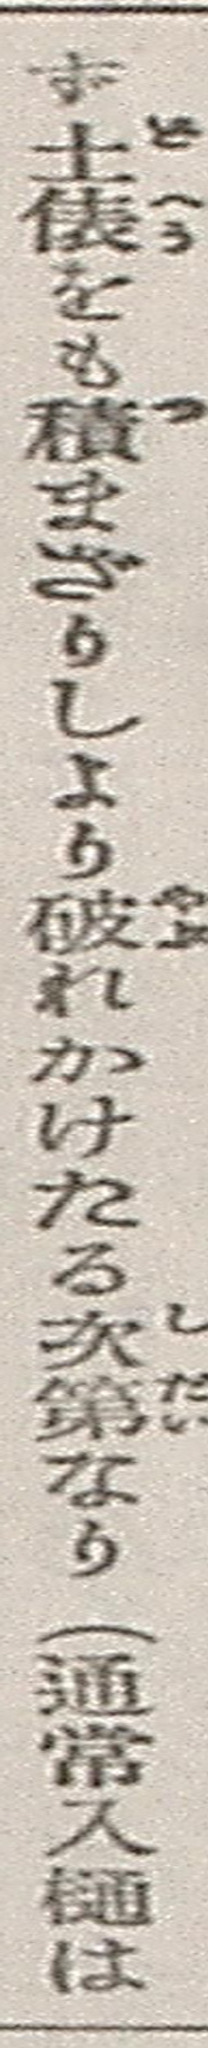ず土俵をも積まざりしより破れかけたる次第なり（通常入樋は
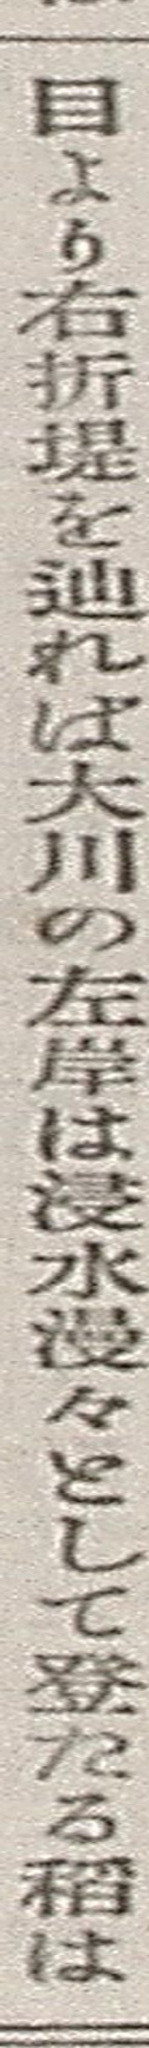目より右折堤を辿れば大川の左岸は浸水漫々として登たる稲は
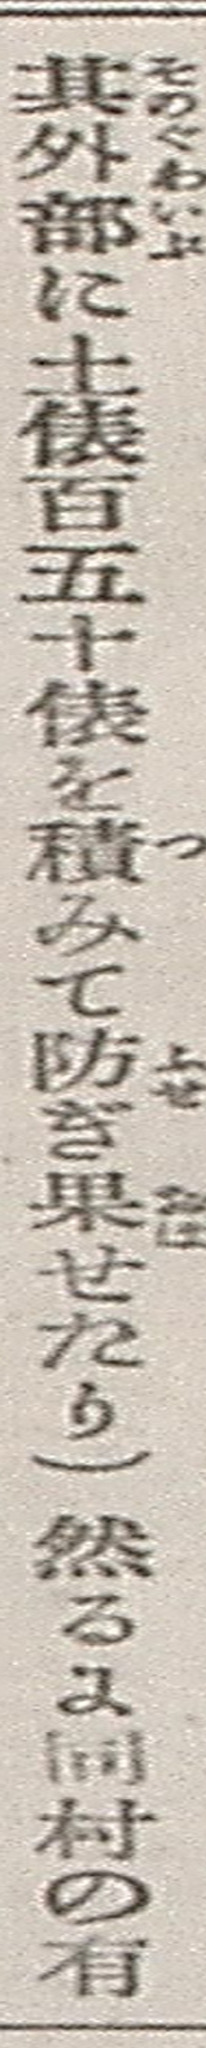其外部に土俵百五十俵を積みて防ぎ果せたり）然るに同村の有
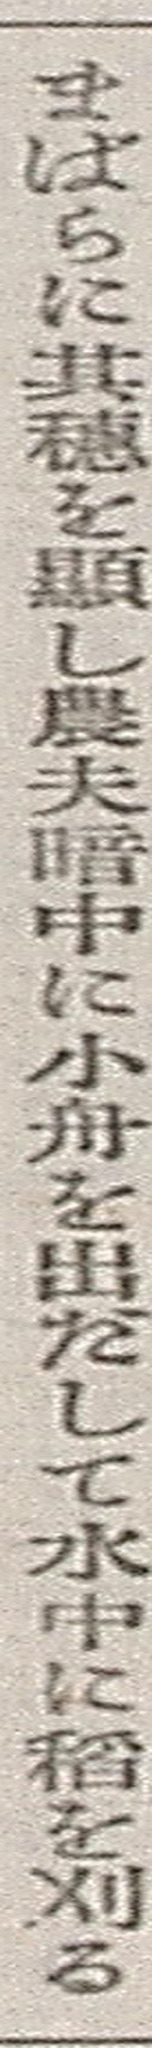まばらに其穂を顕し農夫暗中に小舟を出だして水中に稲を刈る
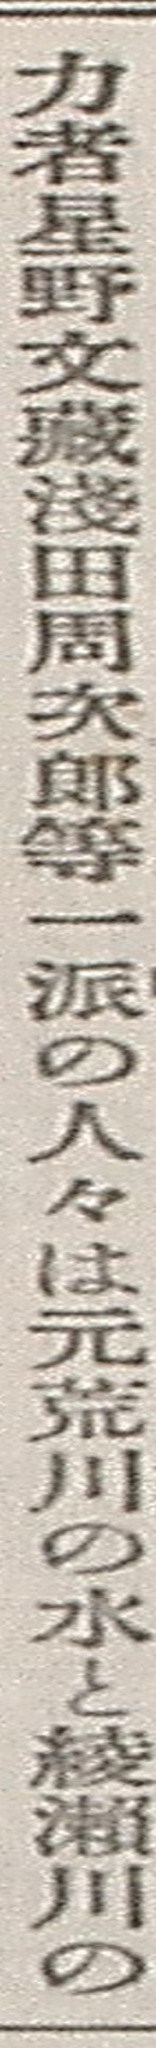力者星野文蔵浅田周次郎等一派の人々は元荒川の水と綾瀬川の
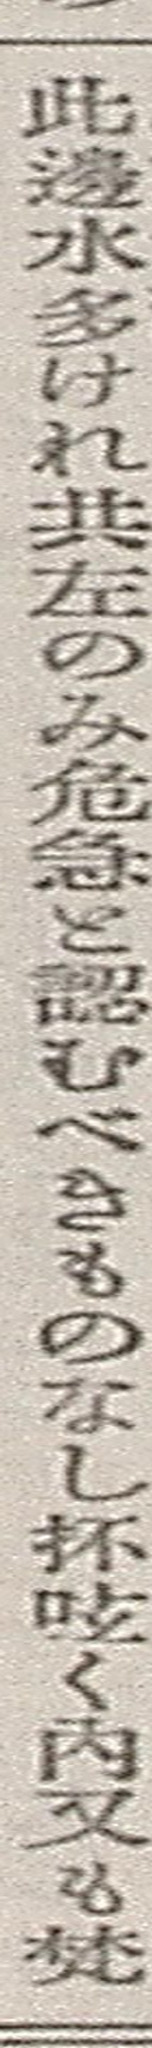此辺水多けれ共左のみ危急と認むべきものなし抔呟く内又も梵
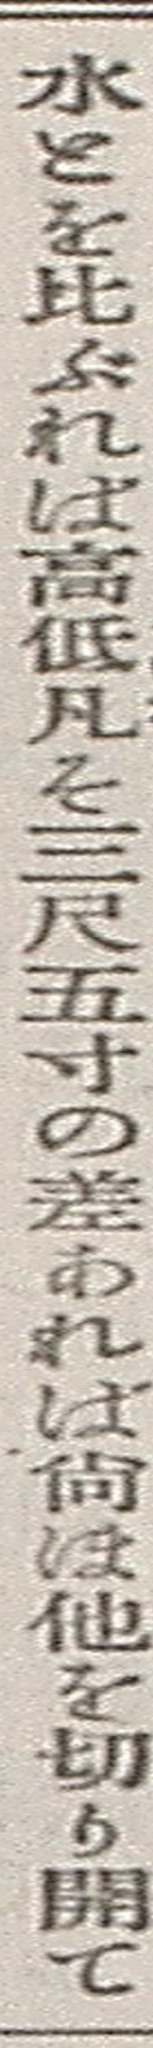水とを比ぶれば高低凡そ三尺五寸の差あれば尚ほ他を切り開て
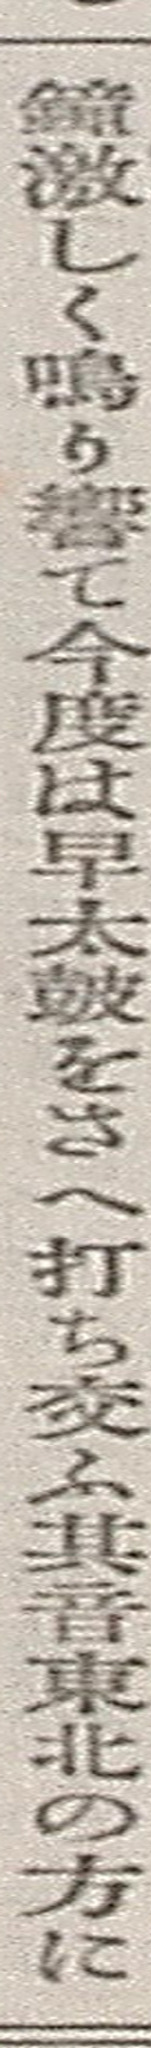鐘激しく鳴り響て今度は早太鼓をさへ打ち交ふ其音東北の方に
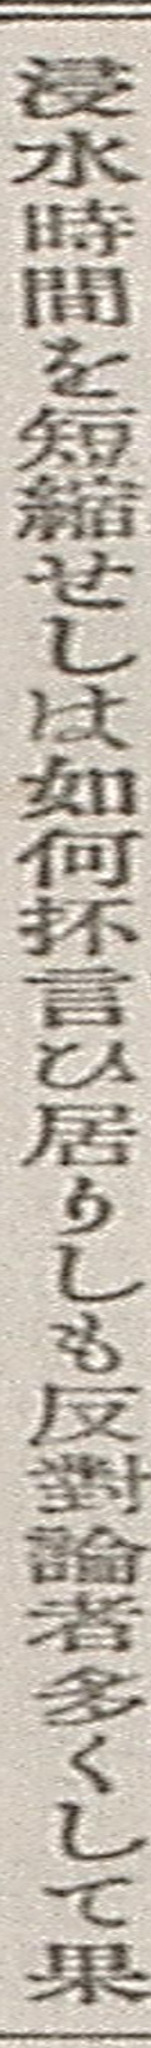浸水時間を短縮せしは如何抔言ひ居りしも反対論者多くして果
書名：風俗畫報臨時増刊第百二十四號　洪水地震被害録（上）
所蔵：東京大学地震研究所図書室 Earthquake Research Institute Library, The University of Tokyo, JAPAN
